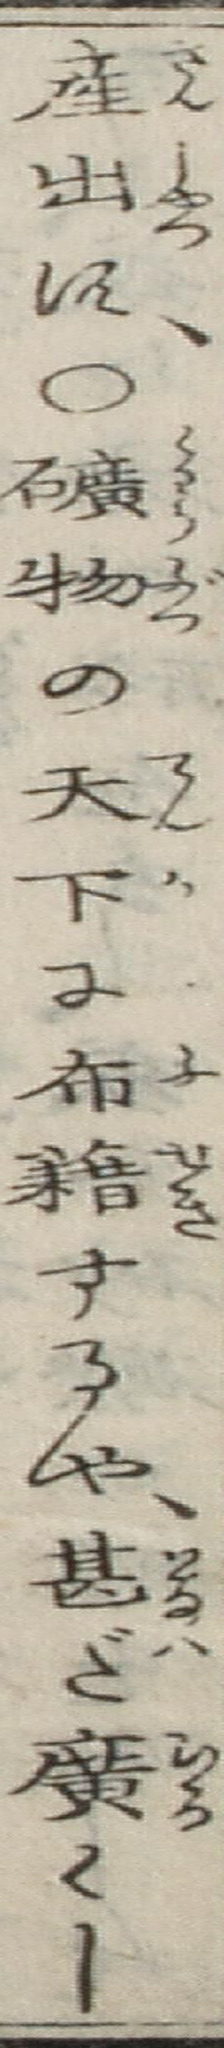産出す、○鉱物の天下に布籍するや、甚だ広くし
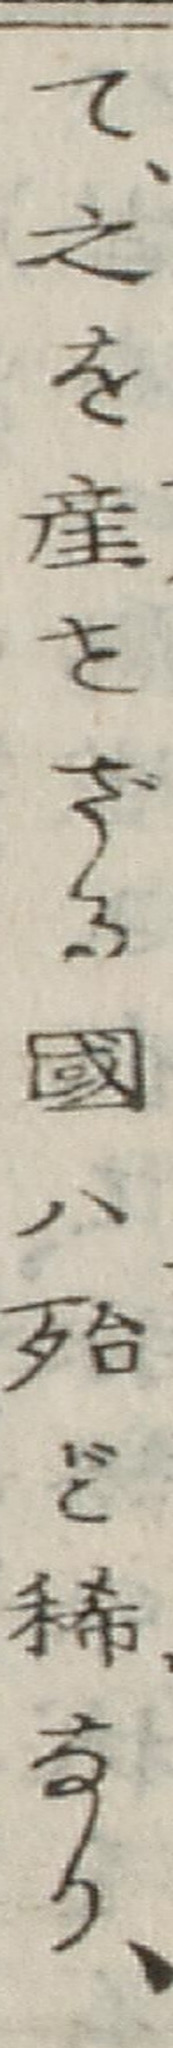て、之を産せざる国は殆ど稀なり、
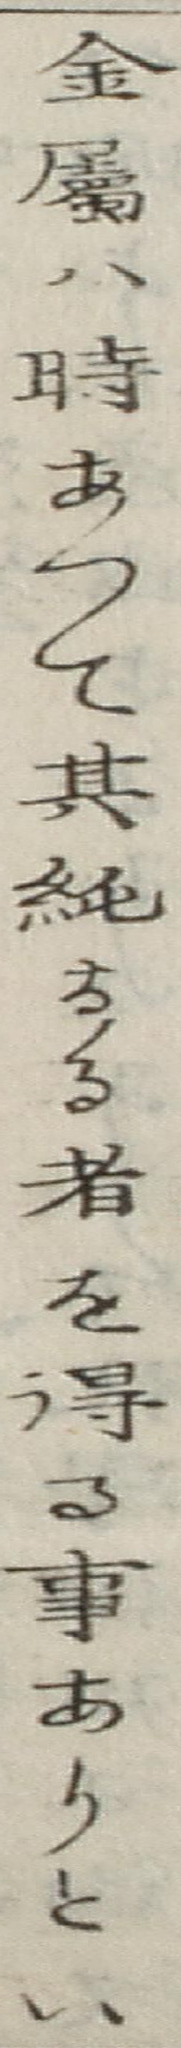金属は時あつて其純なる者を得る事ありとい
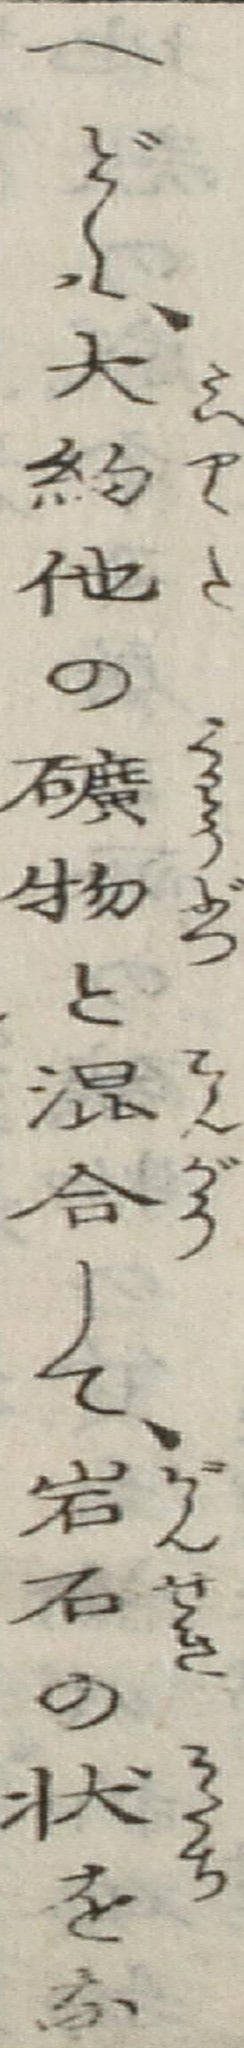へども、大約他の鉱物と混合して、岩石の状をな
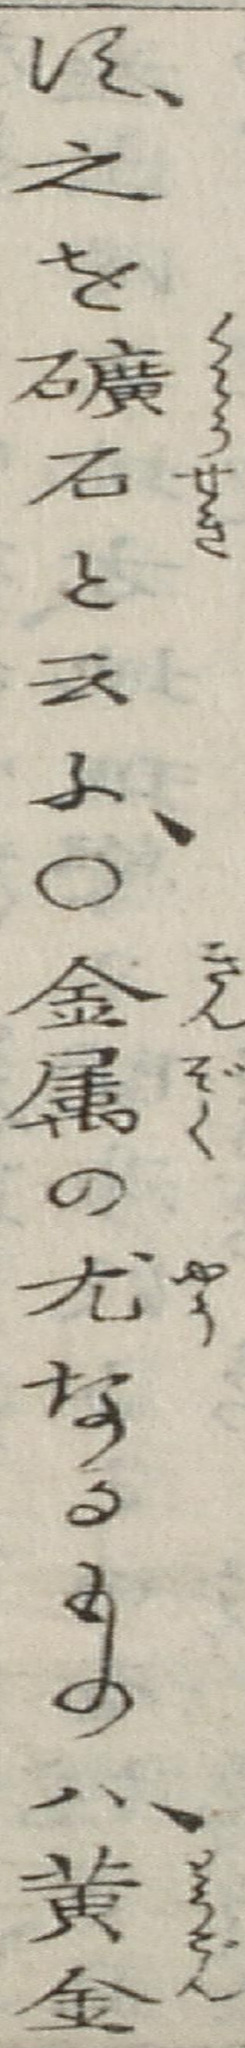す、之を鉱石と云ふ、○金属の尤なるものは、黄金、
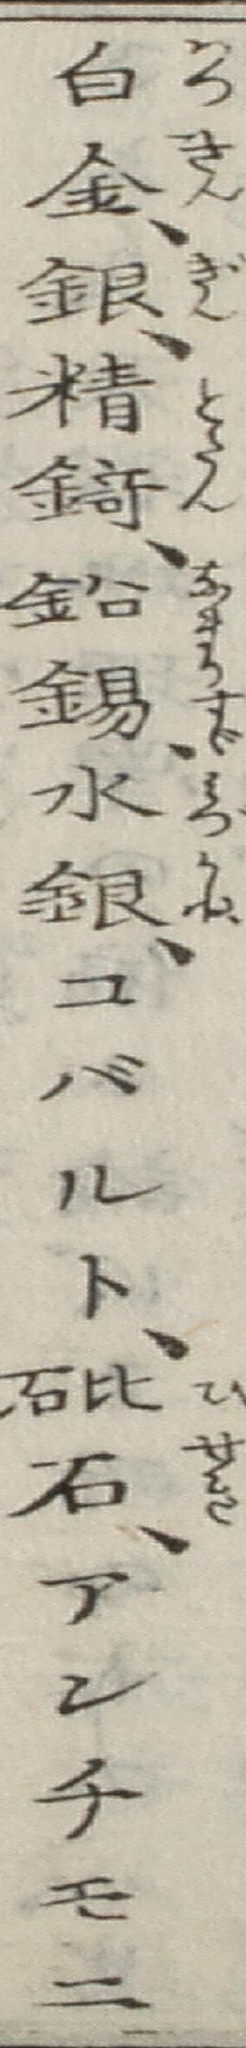白金、銀、精錡、鉛錫、水銀、コバルト、砒石、アンチモニ
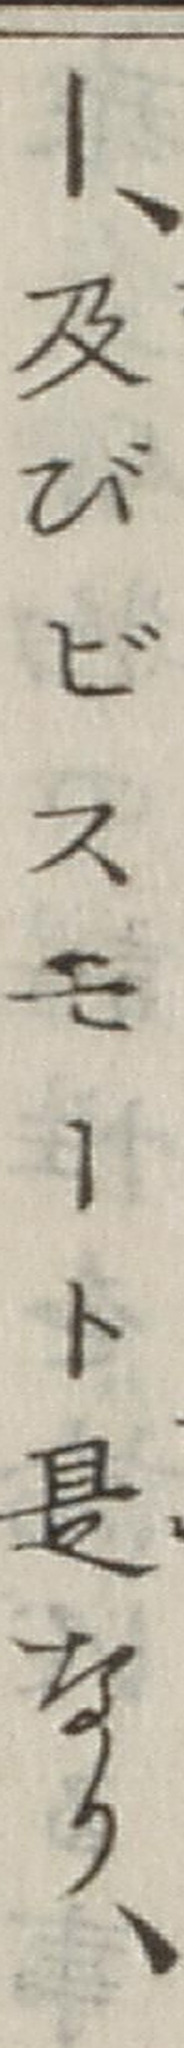ー、及びビスモート是なり、
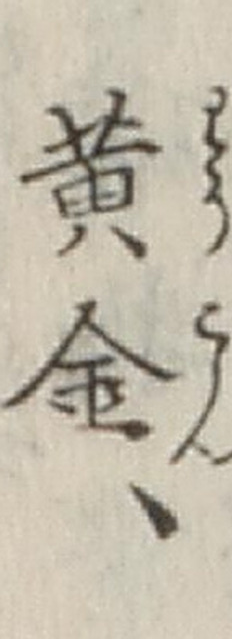黄金、
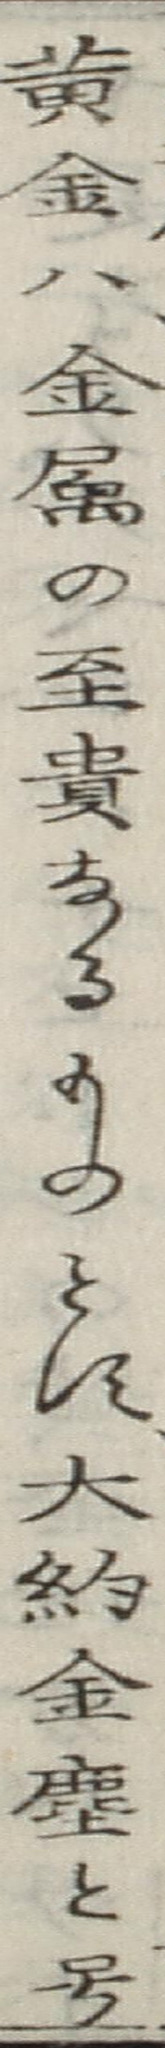黄金は、金属の至貴なるものとす、大約金塵と号
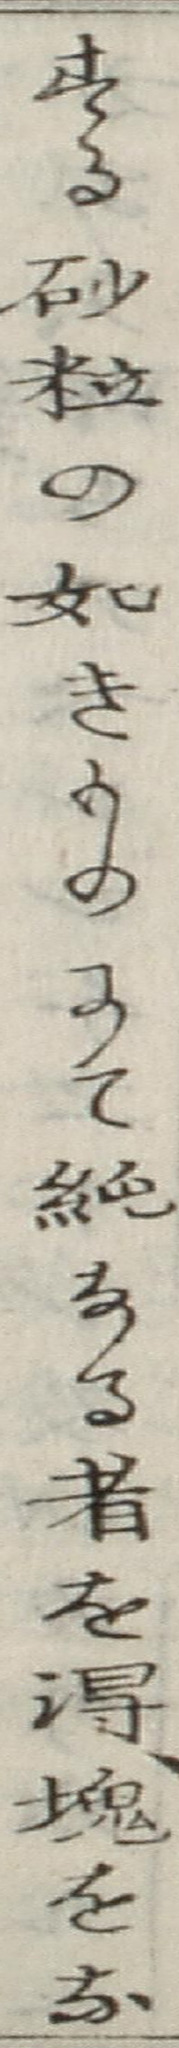する砂粒の如きものにて純なる者を得、塊をな
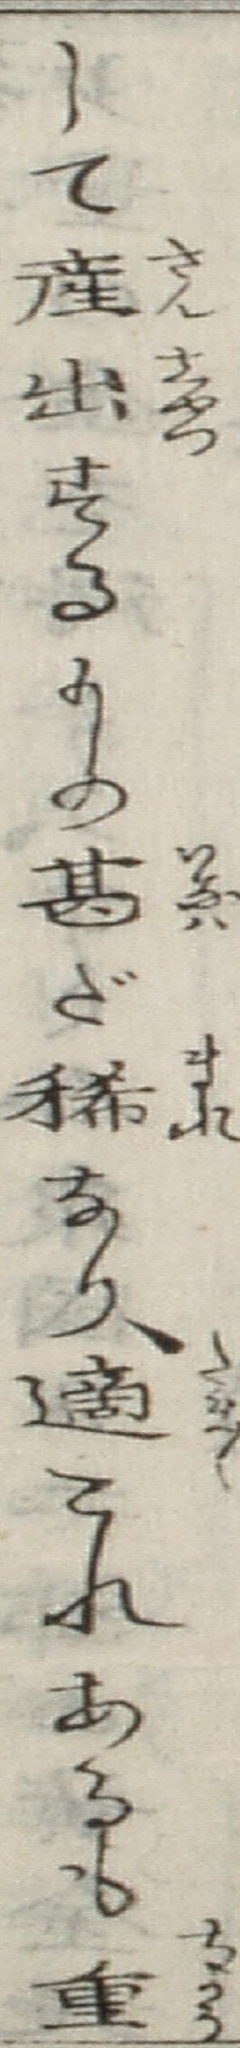して産出するもの甚だ稀なり、適これあるも重
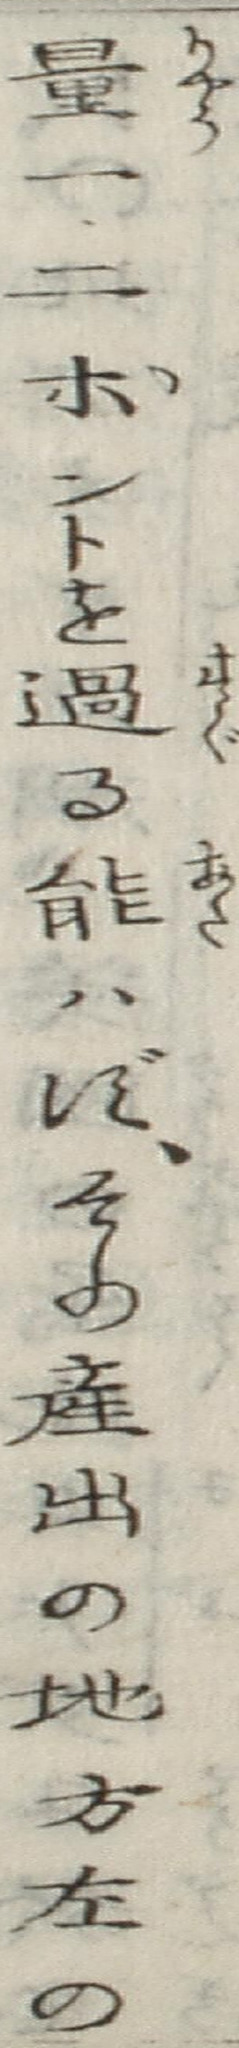量一二ポントを過る能はず、その産出の地方左の
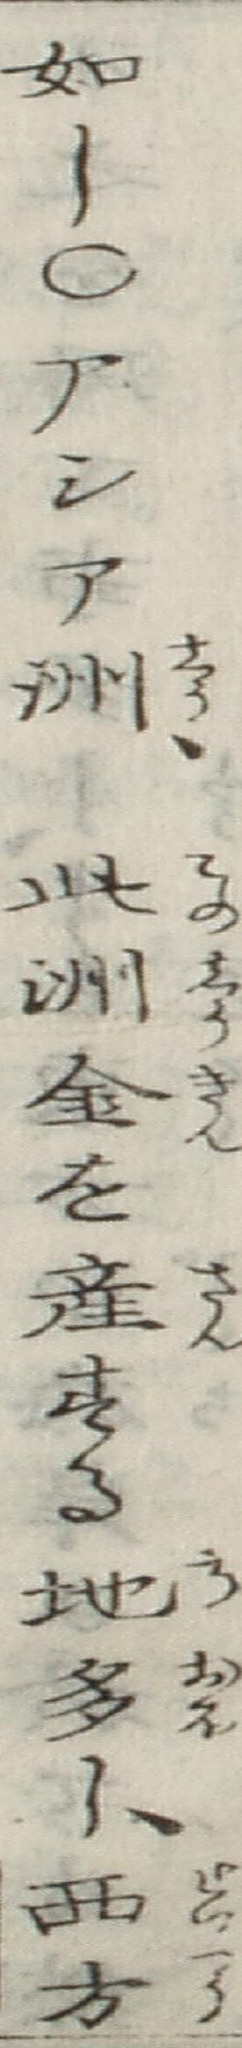如し○アシア洲、此洲金を産する地多し、西方
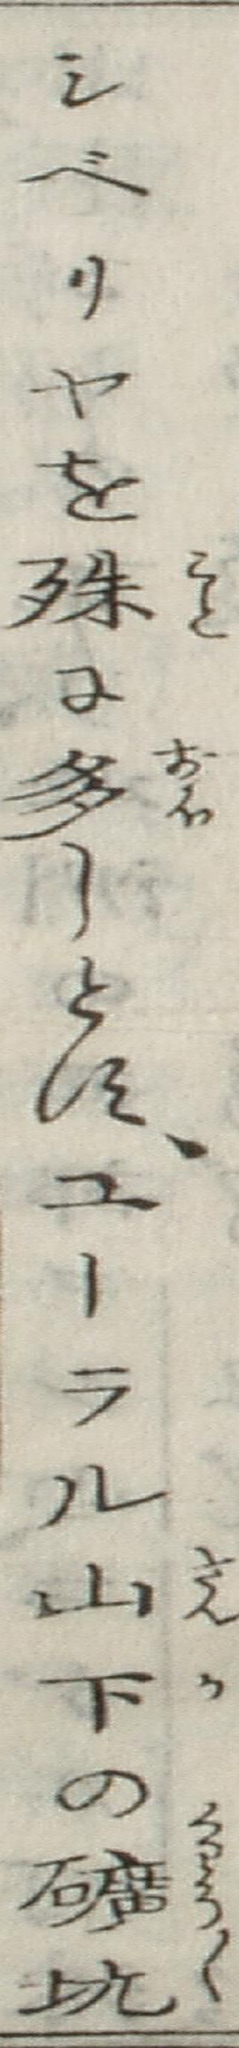シベリヤを殊に多しとす、ユーラル山下の鉱坑
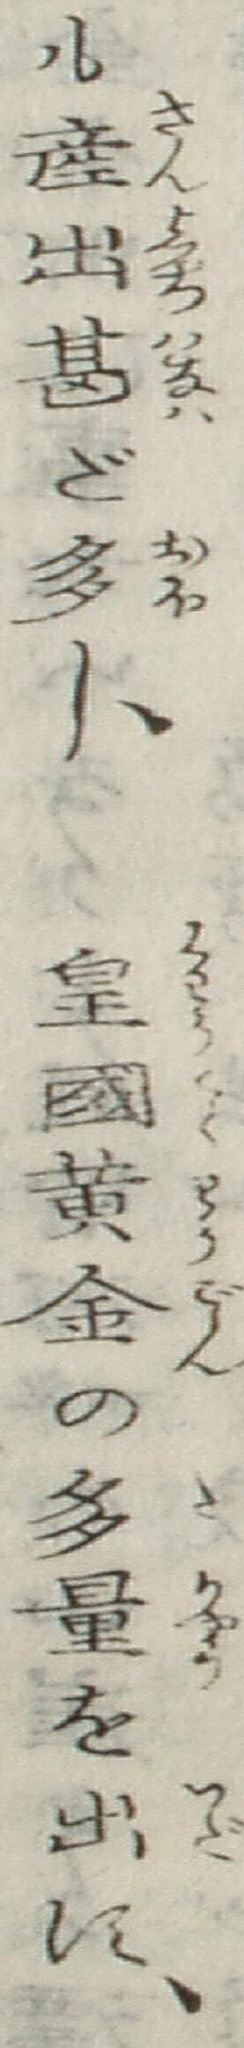も産出甚だ多し、皇国黄金の多量を出す、
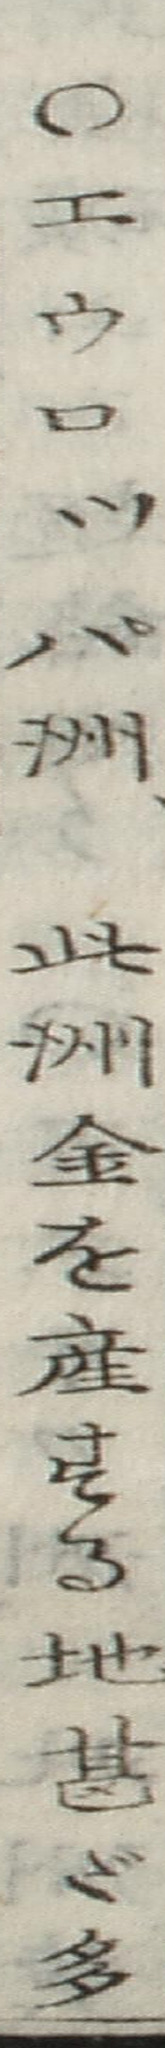○エウロツパ洲、此洲金を産する地甚だ多
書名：訓蒙　天然地理學　下
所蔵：東京大学地震研究所図書室 Earthquake Research Institute Library, The University of Tokyo, JAPAN
